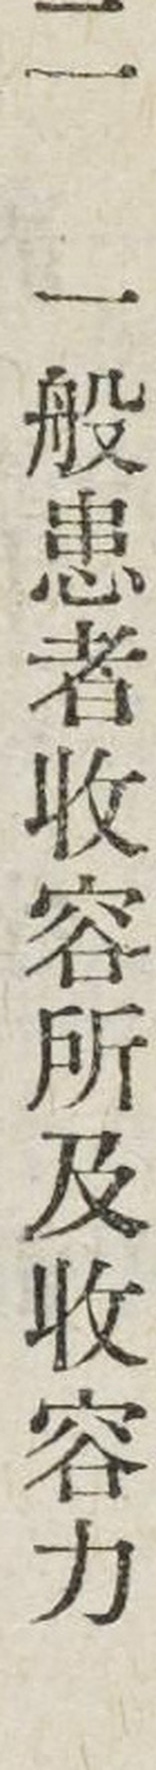一般患者収容所及収容力
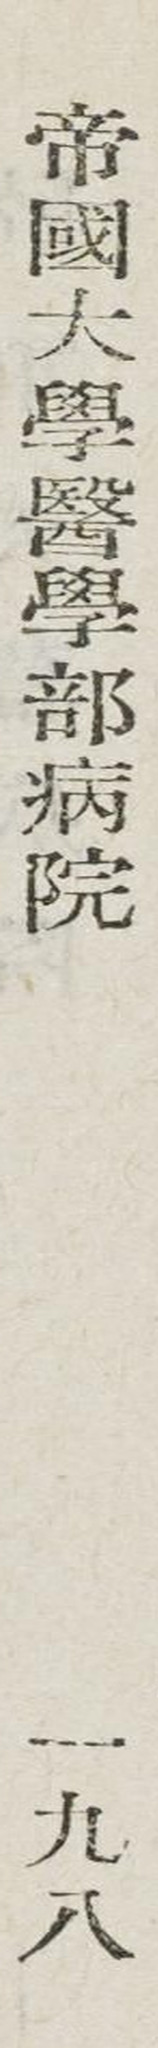帝国大学医学部病院一九八――

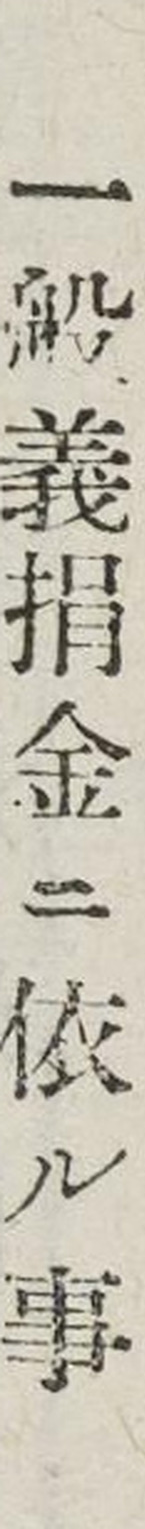一般義捐金ニ依ル事
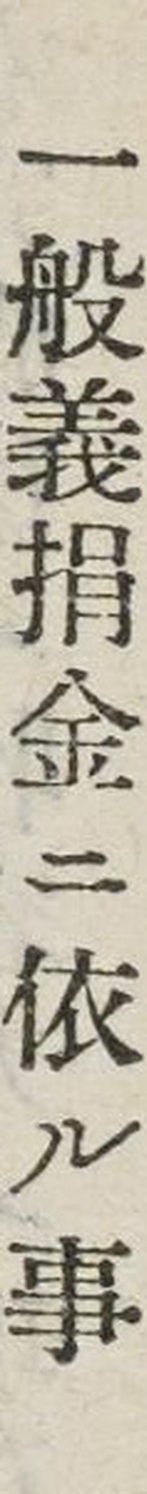一般義捐金ニ依ル事
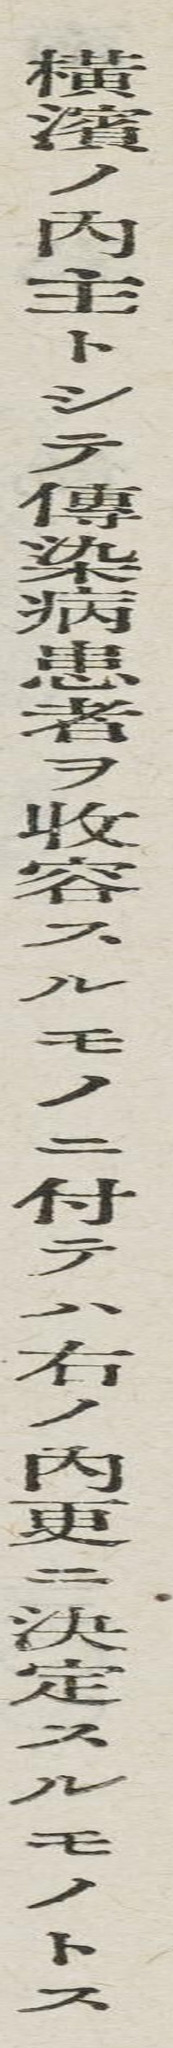横浜ノ内主トシテ伝染病患者ヲ収容スルモノニ付テハ右ノ内更ニ決定スルモノトス
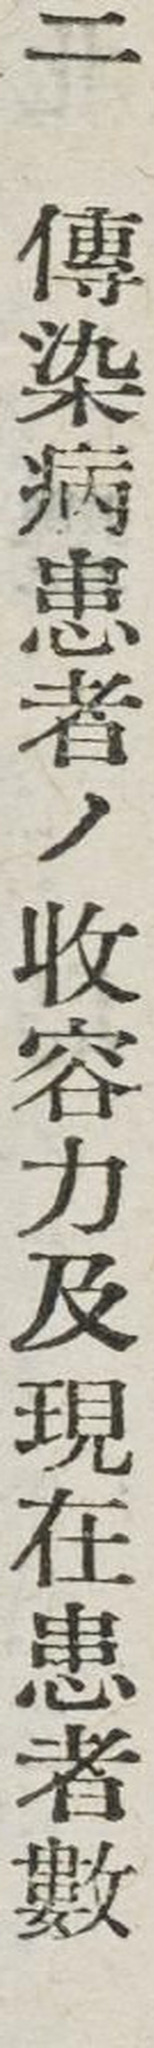伝染病患者ノ収容力及現在患者数

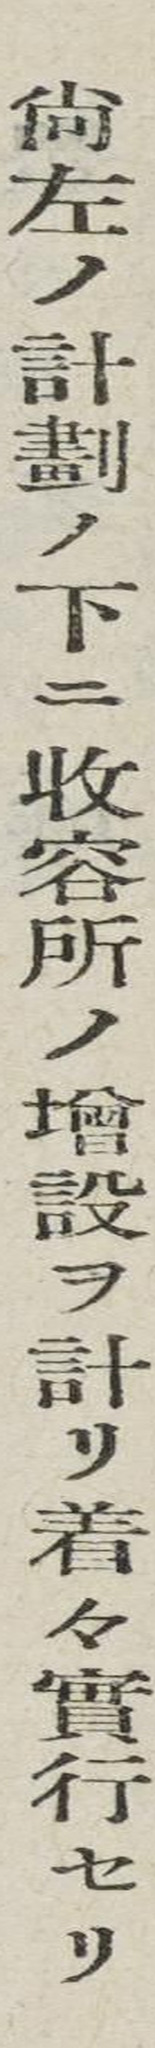尚左ノ計画ノ下ニ収容所ノ増設ヲ計リ着々実行セリ
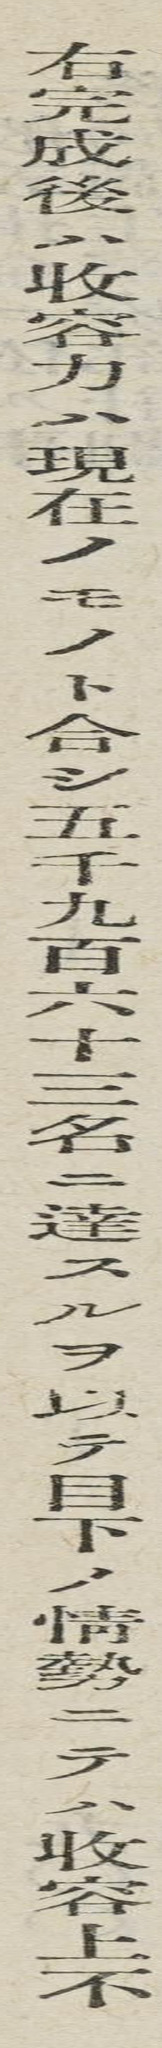右完成後ハ収容力ハ現在ノモノト合シ五千九百六十三名ニ達スルヲ以テ目下ノ情勢ニテハ収容上不
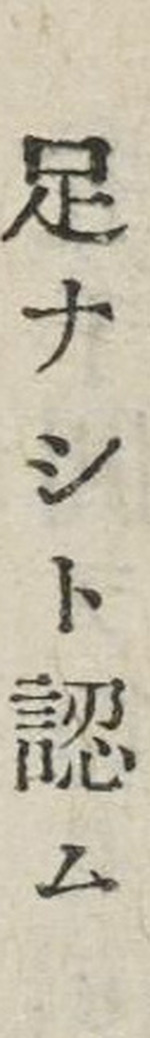足ナシト認ム
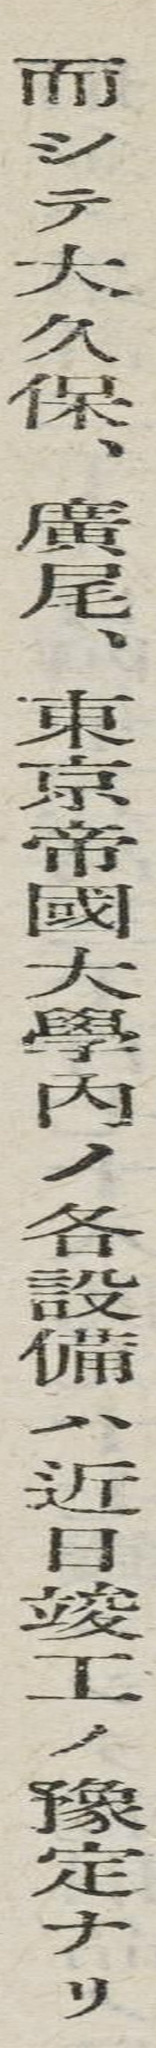而シテ大久保、広尾、東京帝国大学内ノ各設備ハ近日竣工ノ予定ナリ
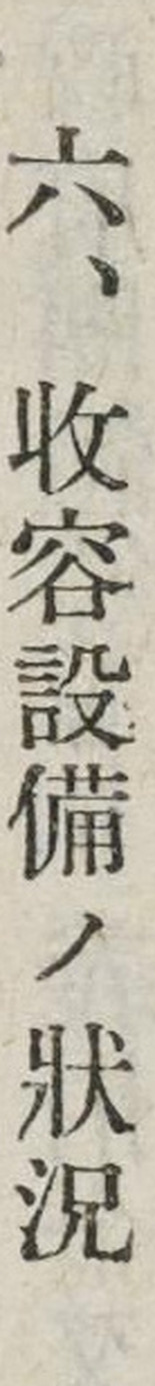六、収容設備ノ状況
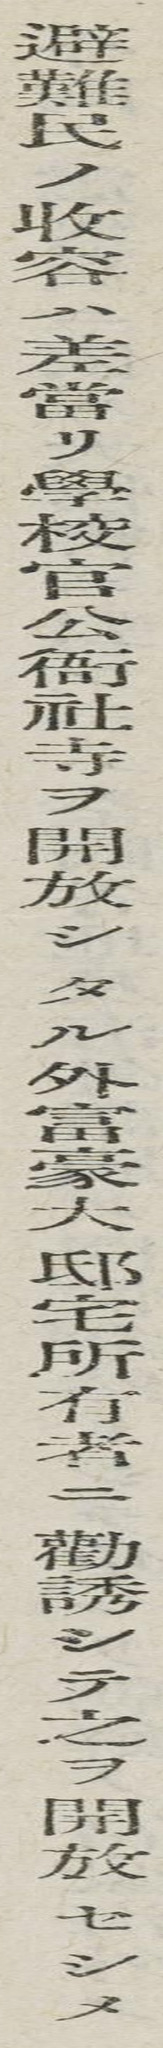避難民ノ収容ハ差当リ学校官公衙社寺ヲ開放シタル外富豪大邸宅所有者ニ勧誘シテ之ヲ開放セシメ
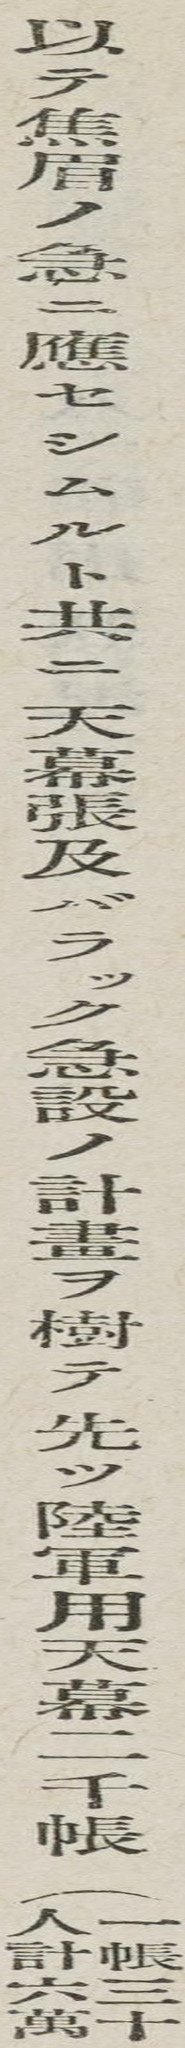以テ焦眉ノ急ニ応セシムルト共ニ天幕張及バラック急設ノ計画ヲ樹テ先ツ陸軍用天幕二千張一張三十人計六万
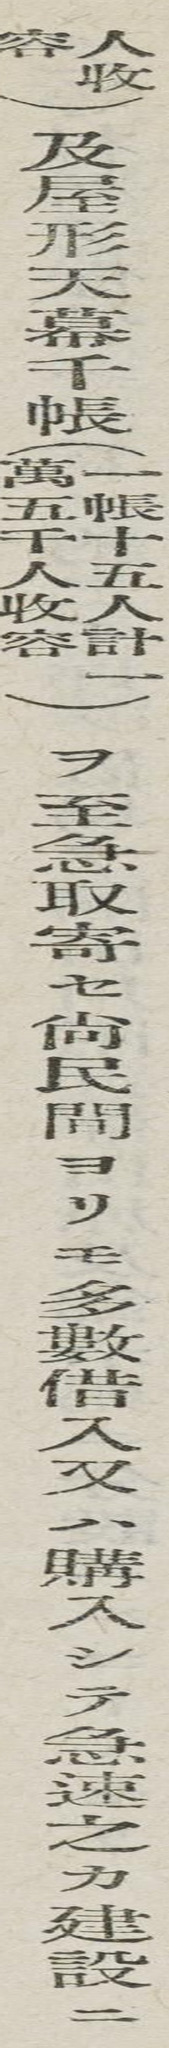人数容）及屋形天幕千張ヲ至急取寄セ尚民間ヨリモ多数借入又ハ購入シテ急速之カ建設ニ
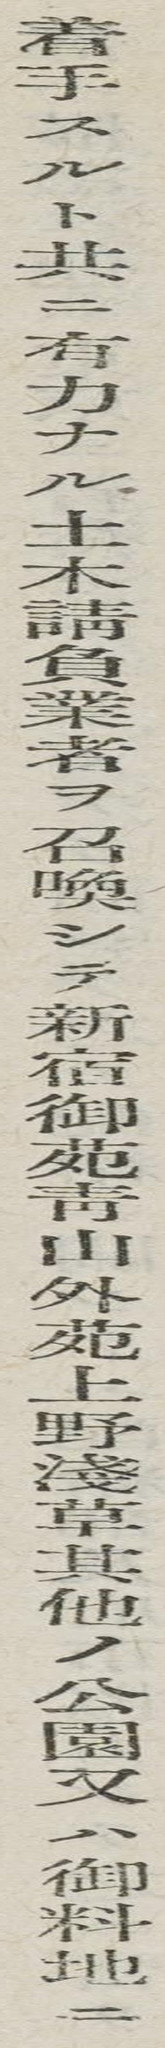着手スルト共ニ有力ナル土木請負業者ヲ召喚シテ新宿御苑青山外苑上野浅草其他ノ公園又ハ御料地ニ
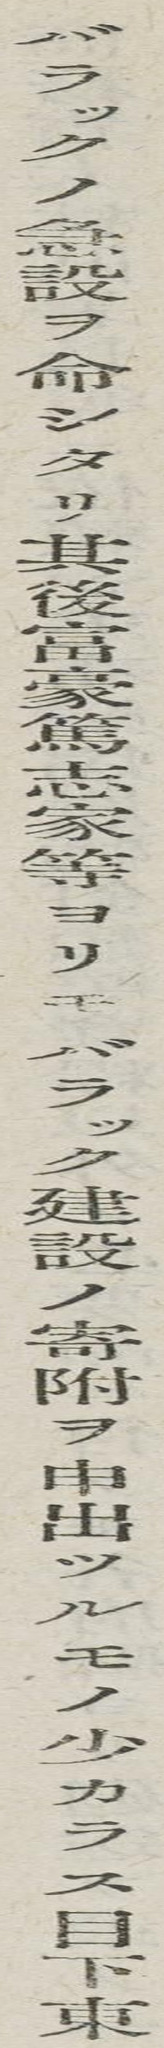バラックノ急設ヲ命シタリ其後富豪篤志家等ヨリモバラック建設ノ寄附ヲ申出ツルモノ少カラス目下東
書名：震災被害状況並救護施設概要
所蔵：東京大学地震研究所図書室 Earthquake Research Institute Library, The University of Tokyo, JAPAN
